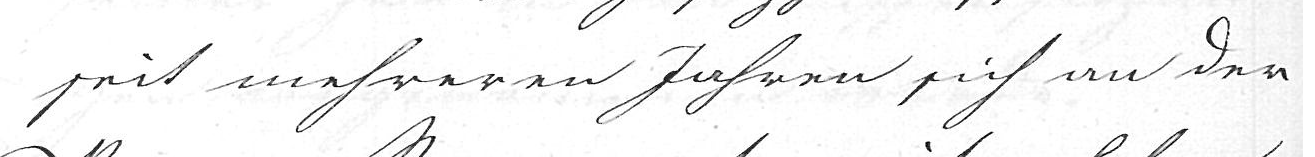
seit mehreren Jahren sich an der
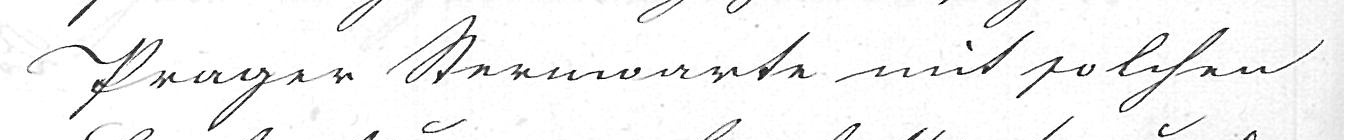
Prager Sternwarte mit solchen
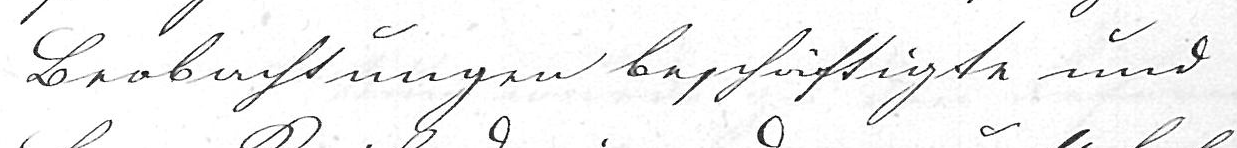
Beobachtungen beschäftigte und
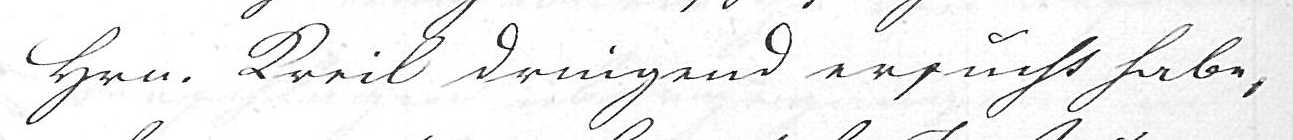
Hrn. Kreil drinigend ersucht habe,
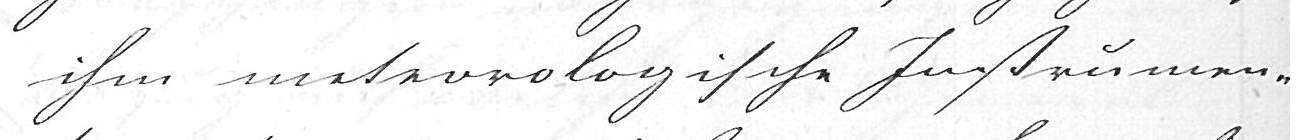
ihm meteorologische Instrumen-
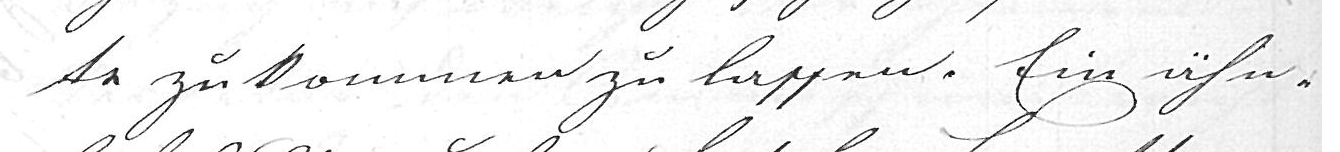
te zukommen zu lassen. Ein ähn-
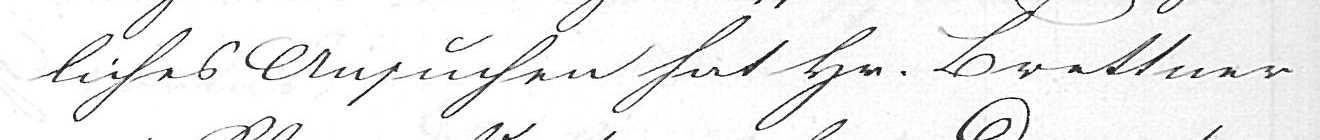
liche Ansuchen hat Hr. Brettner
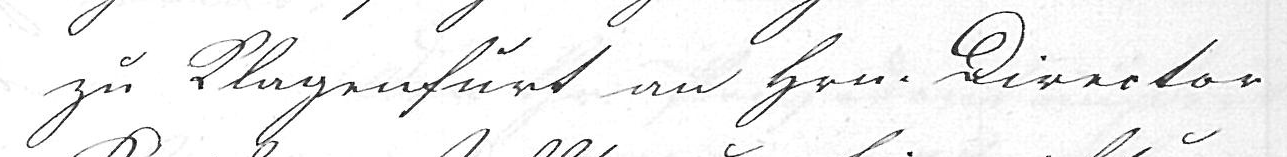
zu Klagenfurt an Hrn. Director
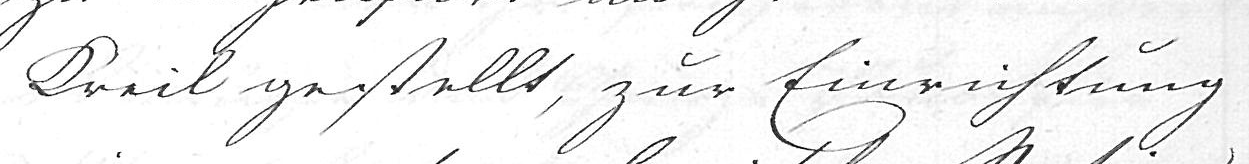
Kreil gestellt, zur Einrichtung
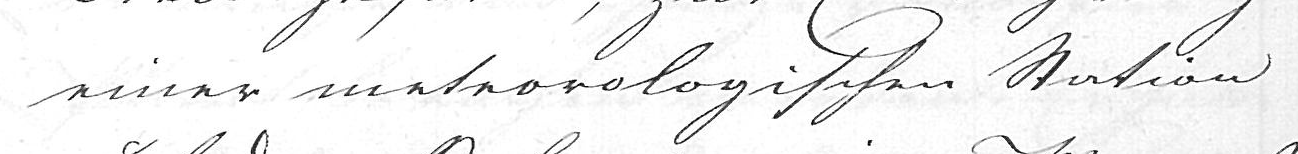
einer meteorologischen Station
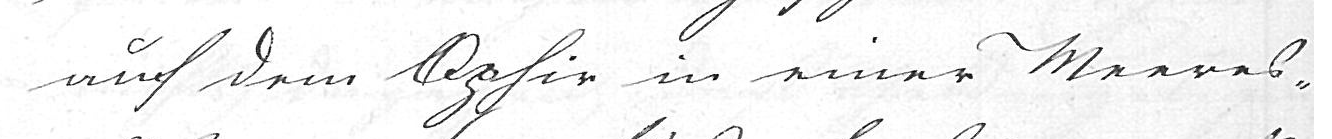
auf dem Ophir in einer Meeres-
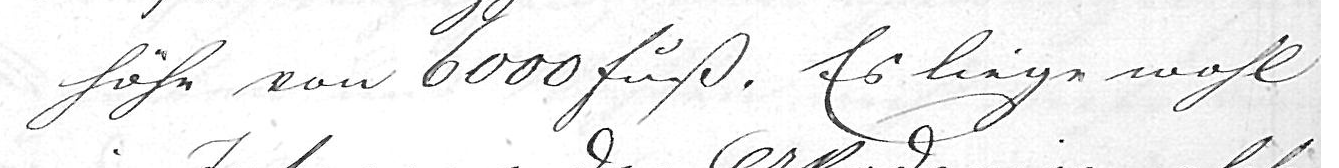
hohe von 6000 Fuß. Es liege wohl
